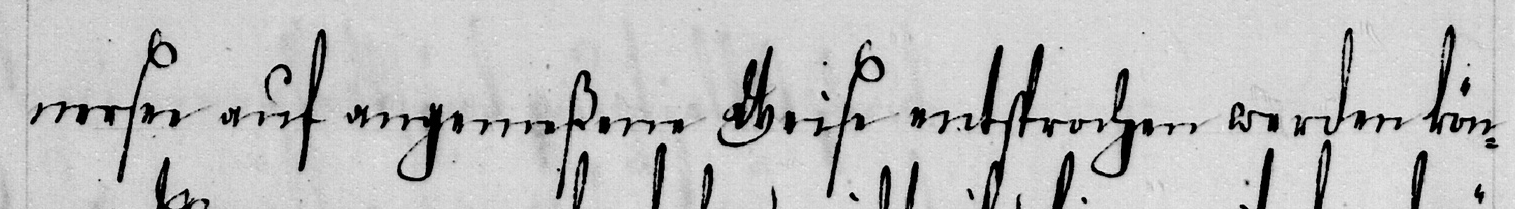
nersee auf angemeßene Weise entsprochen werden kön¬
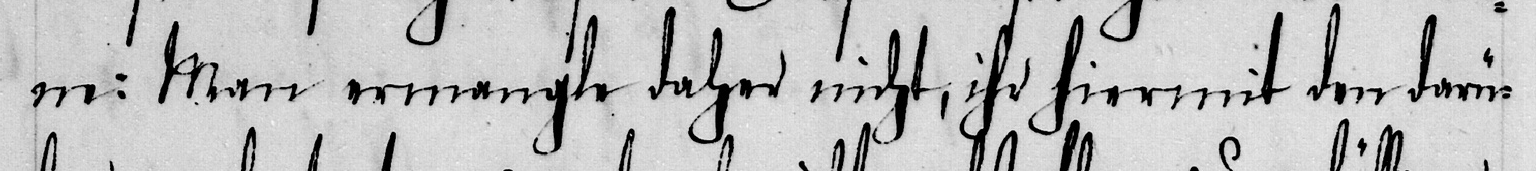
ne: Man ermangle daher nicht, ihr hiermit den darü¬
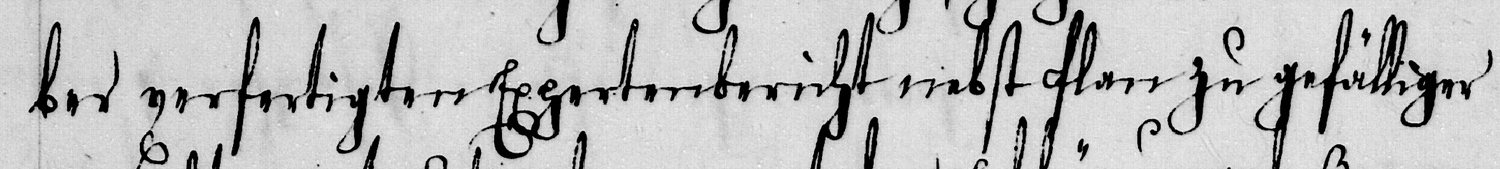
ber verfertigten Expertenbericht nebst Plan zu gefällig¬
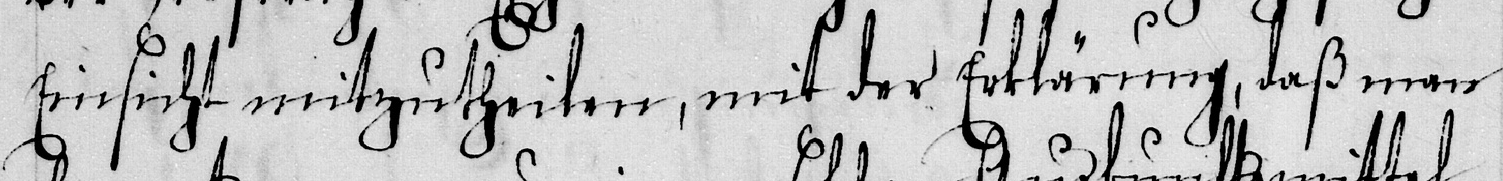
Einsicht mitzutheilen, mit der Erklärung, daß man
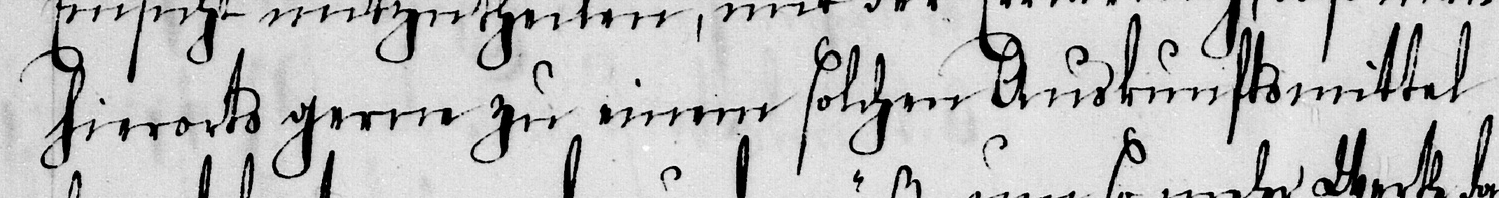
hierorts gerne zu einem solchen Auskunftsmittel
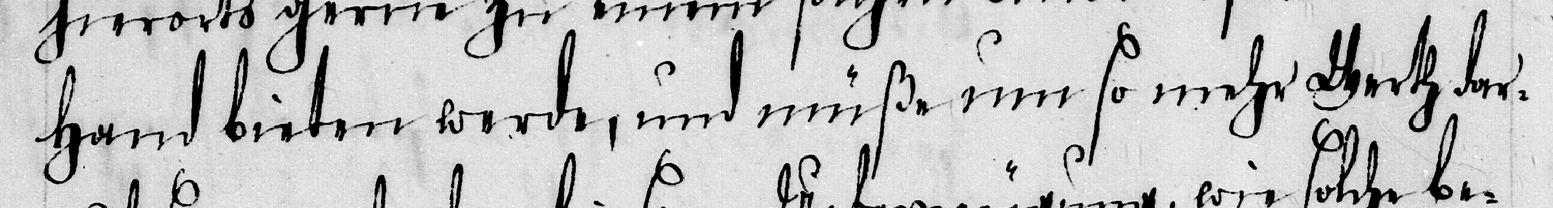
Hand bieten werde, und müße um so mehr Werth dar¬
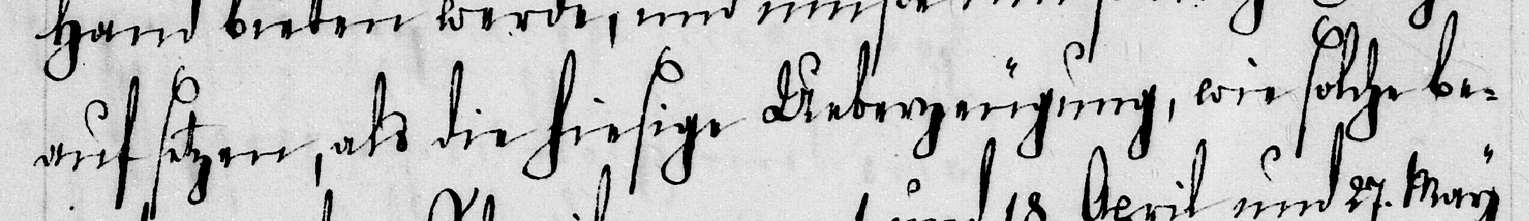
auf setzen, als die hiesige Ueberzeugung, wie solche b¬
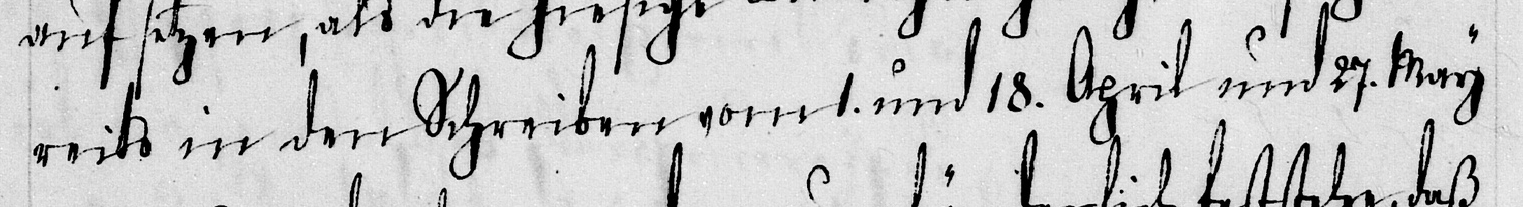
ereits in den Schreiben vom 1. und 18. April und 27. März
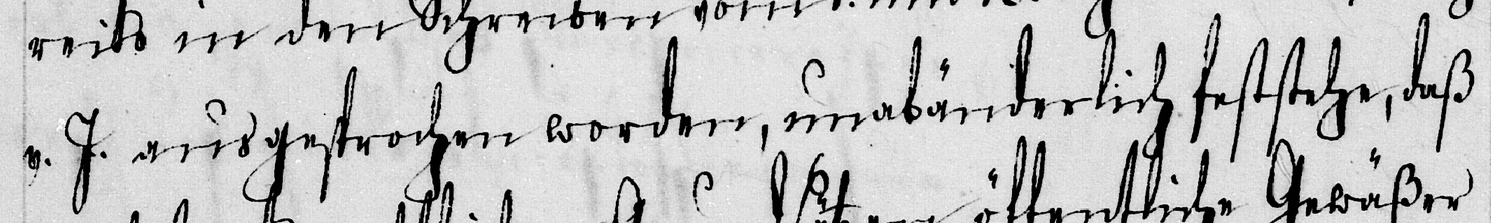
v. J. ausgesprochen worden, unabänderlich festhalte, daß
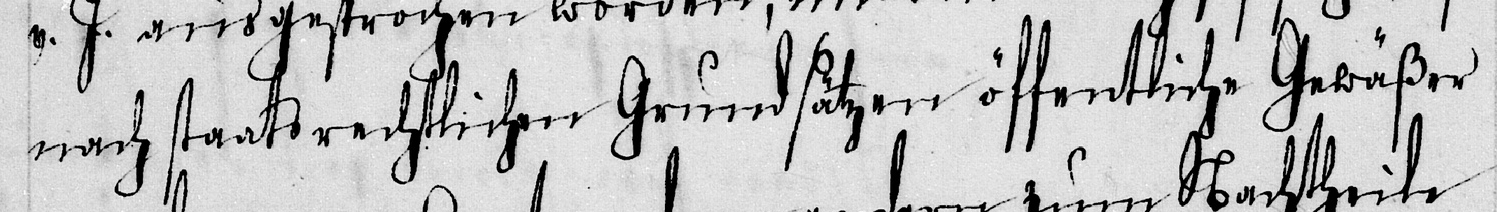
nach staatsrechtlichen Grundsätzen öffentliche Gewäßer
